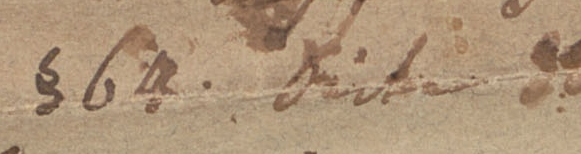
§ 64. Seite 9
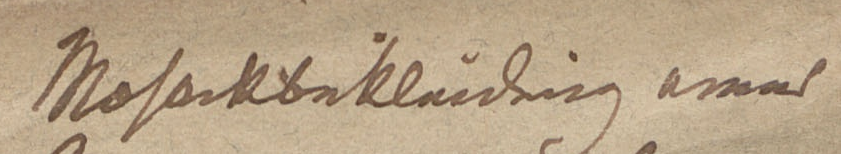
Mosaikbekleidung einer
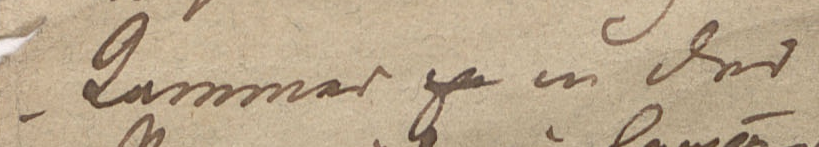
Kammer zu in der
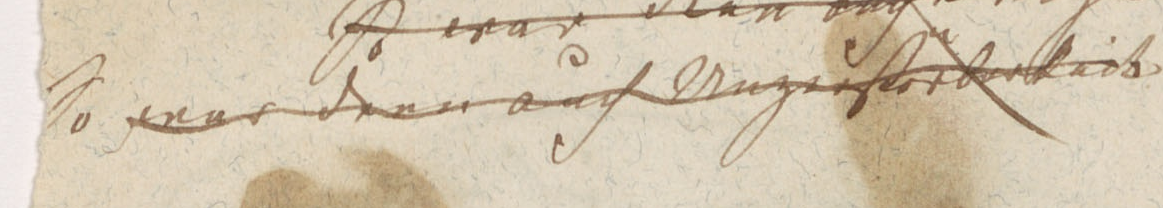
So war denn auch Unzerstörbarkeit
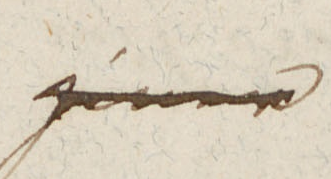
So war denn
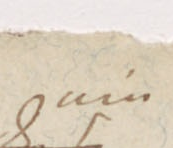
ewige
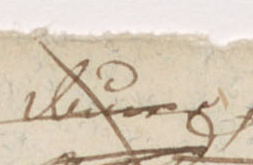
Dauer,
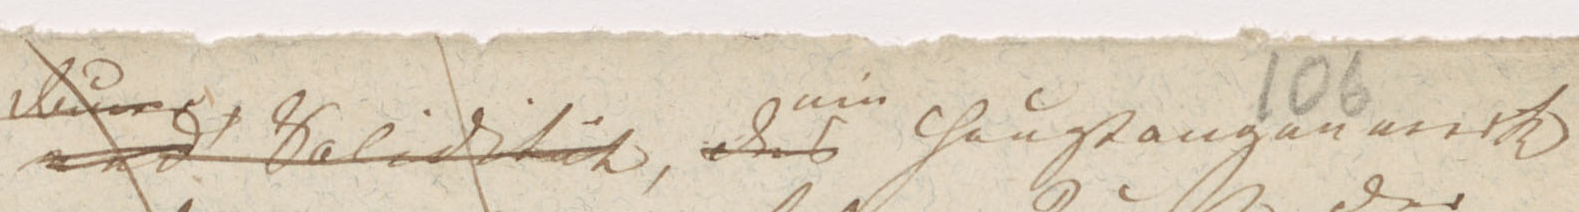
und Solidität, das ein Hauptaugenmerk
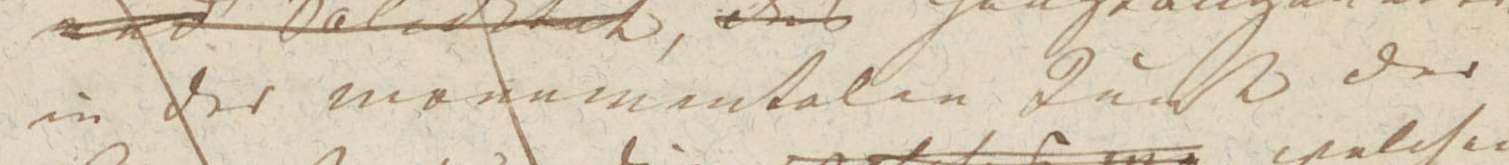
in der monumentalen Kunst der
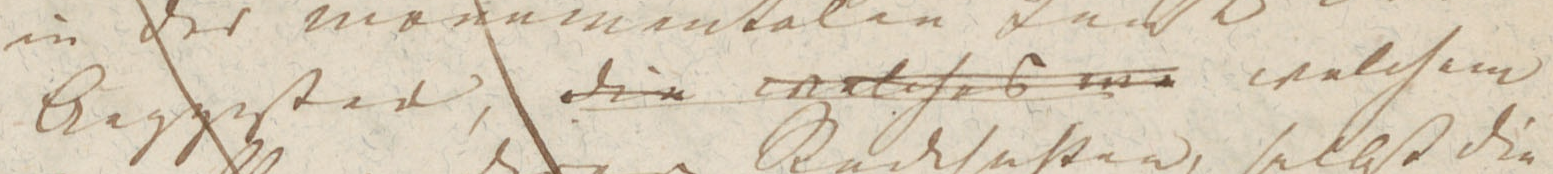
Aegypter, die welches m welchem
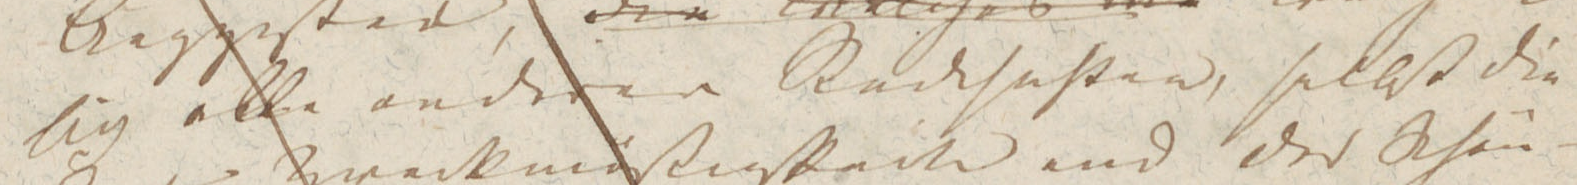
sich alle anderen Rücksichten, selbst die
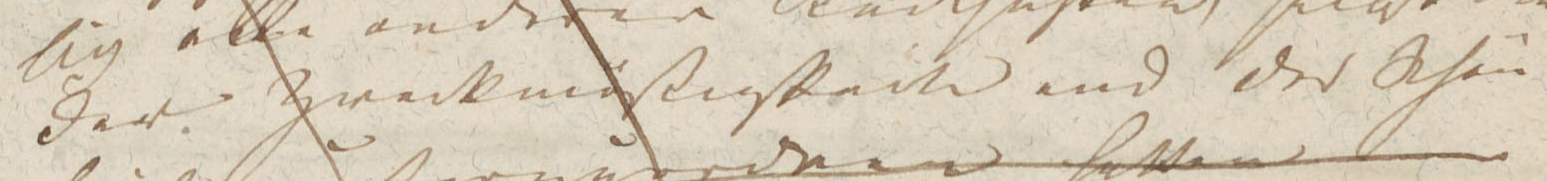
der Zweckmässigkeit und der Schön-
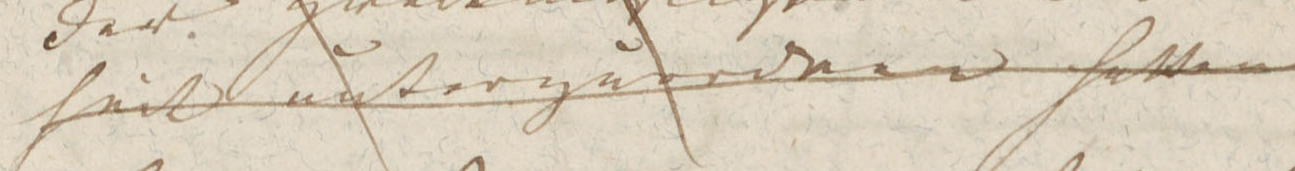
heit unterzuordnen hatten
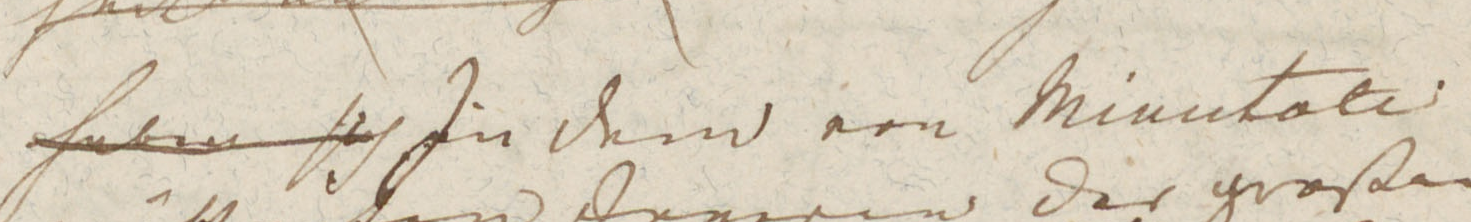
haben sich iIn dem von Minutoli
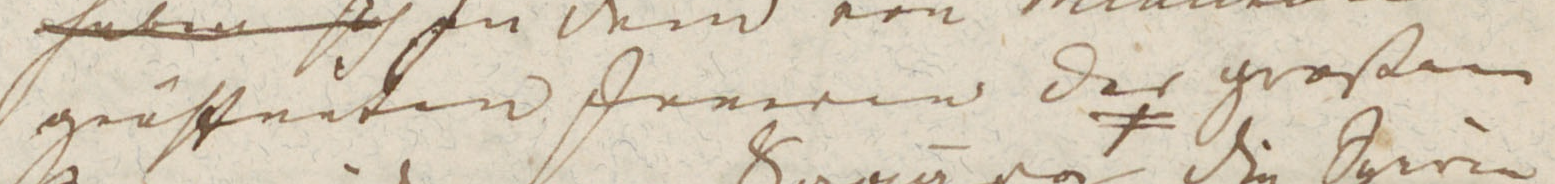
geöffneten Inneren der grossen
